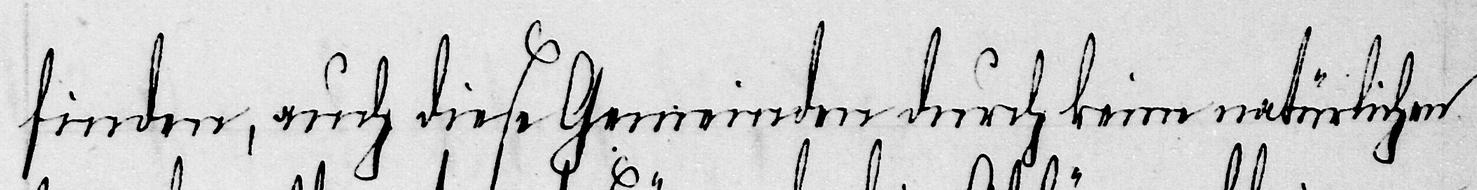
finden, auch diese Gemeinden durch keine natürlichen
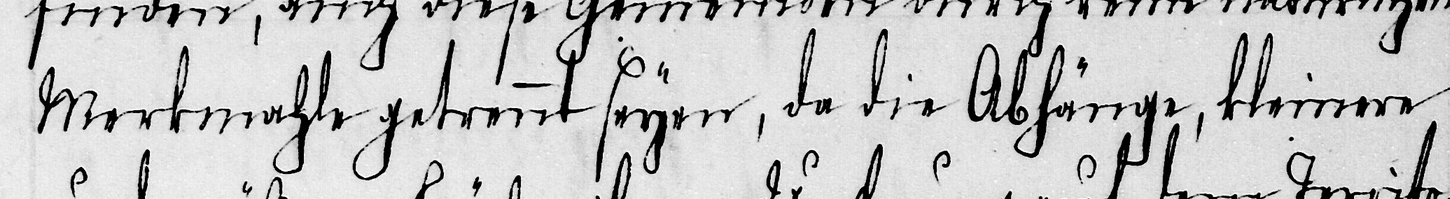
Merkmahle getrennt seyen, da die Abhänge, kleinere
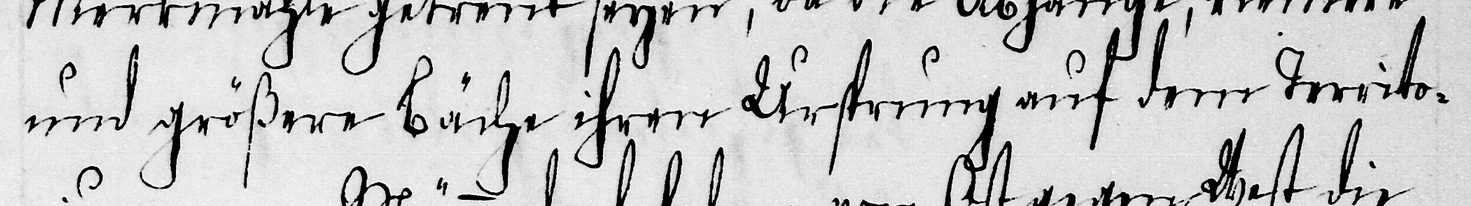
und größere Bäche ihren Ursprung auf dem Territo¬
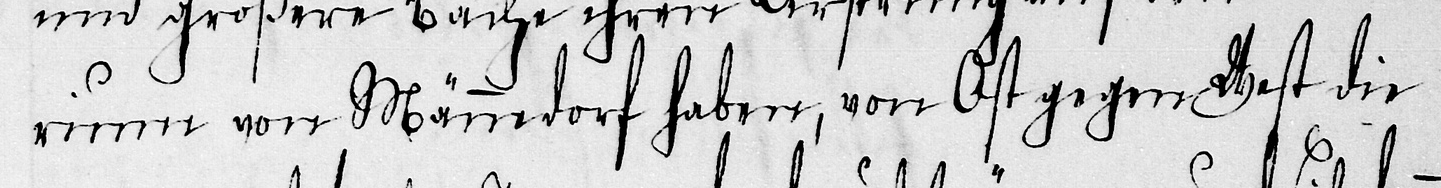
rium von Männedorf haben, von Ost gegen West die
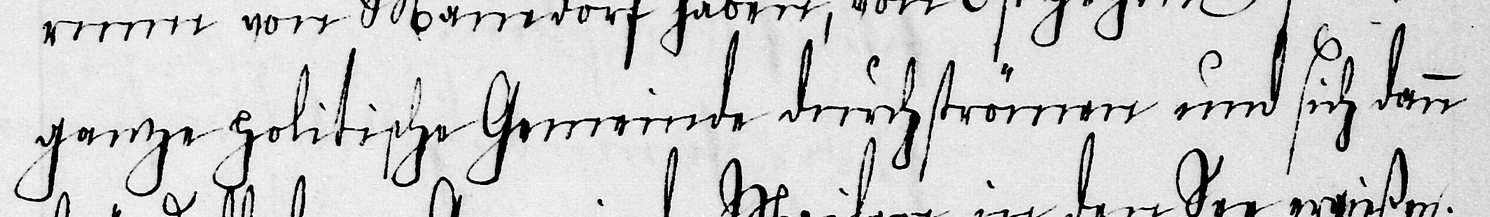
ganze politische Gemeinde durchströmen und sich dann
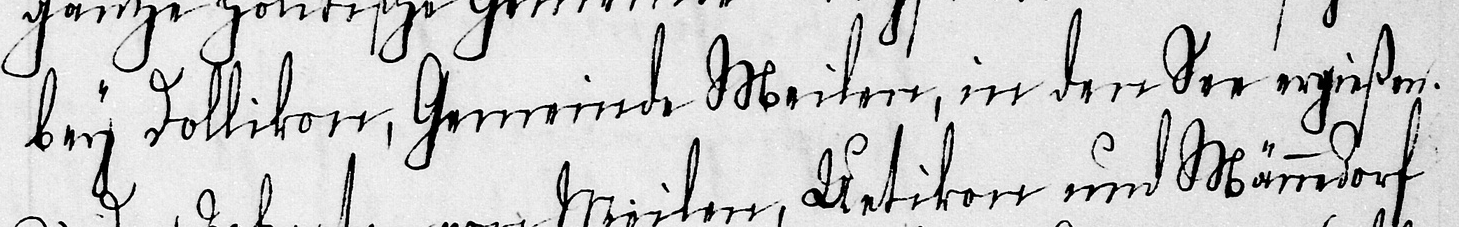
bey Dollikon, Gemeinde Meilen, in den See ergießen.
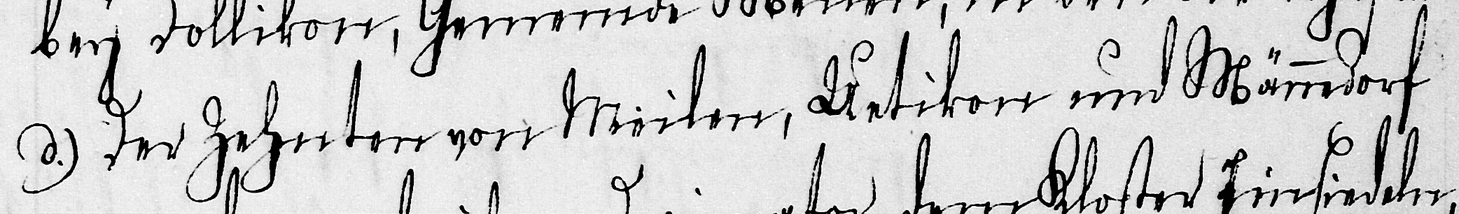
d.) Der Zehnten von Meilen, Uetikon und Männedorf
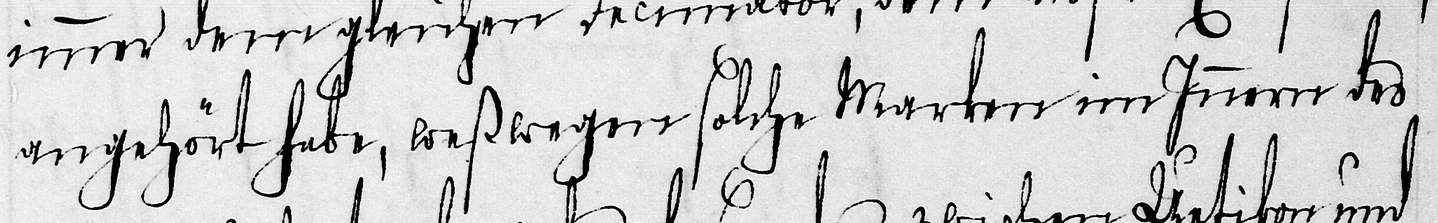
angehört habe, weßwegen solche Marken im Innern des
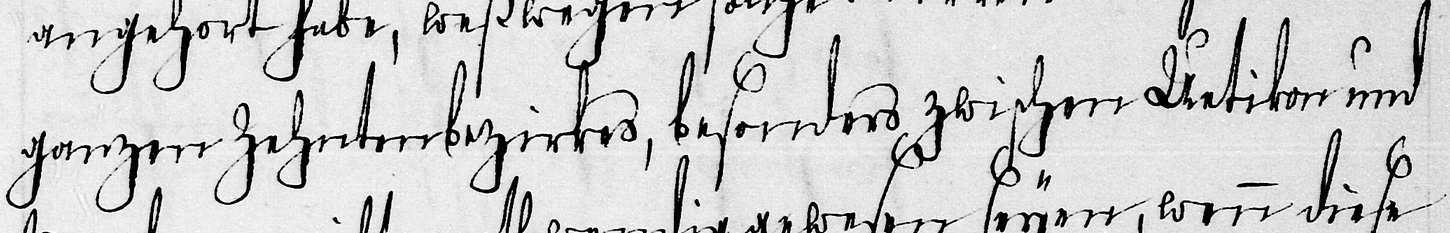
ganzen Zehntenbezirkes, besonders zwischen Uetikon und
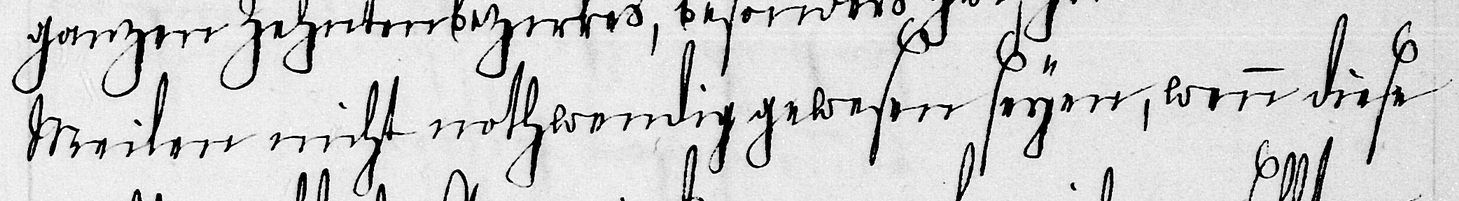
Meilen nicht nothwendig gewesen seyen, wenn diese
